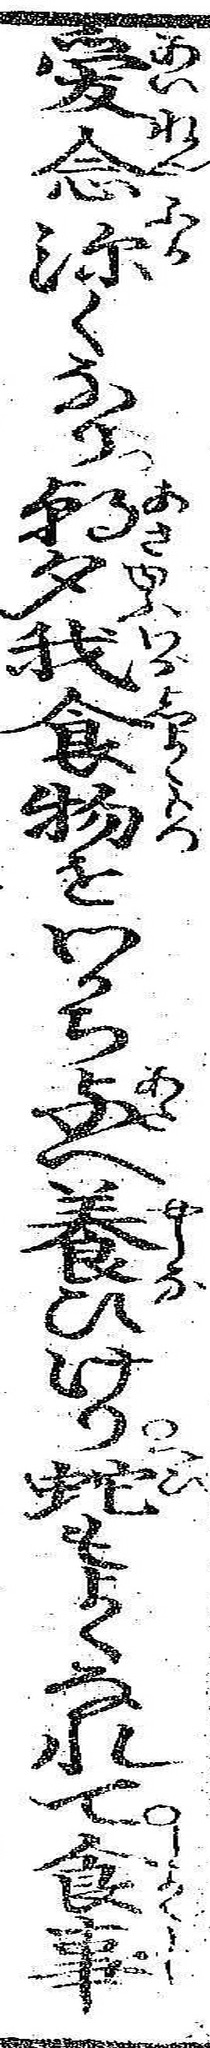愛念深くなり。朝夕我食物をわかち与へ養ひけり。蛇もよくなれて。食事
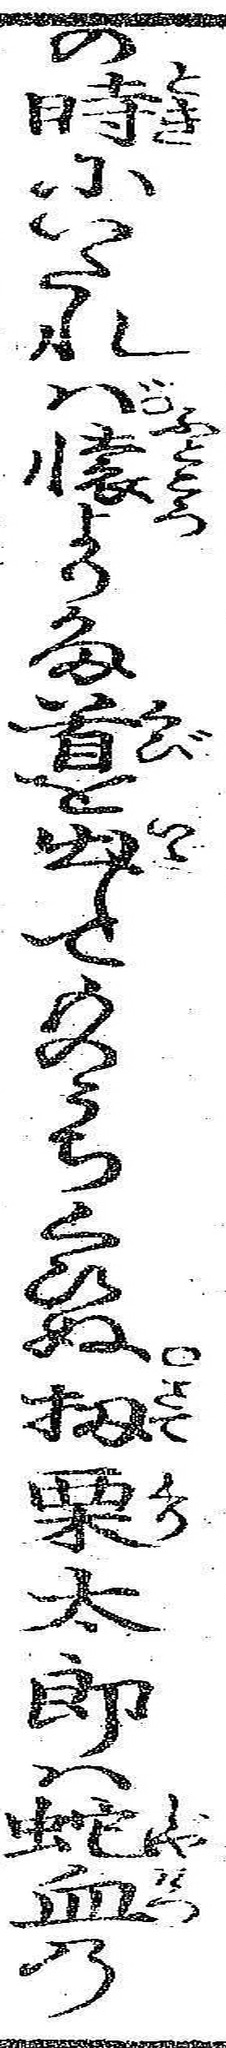の時にいたれば。懐よりかま首を出してものうちくひぬ。扨栗太郎は蛇血の
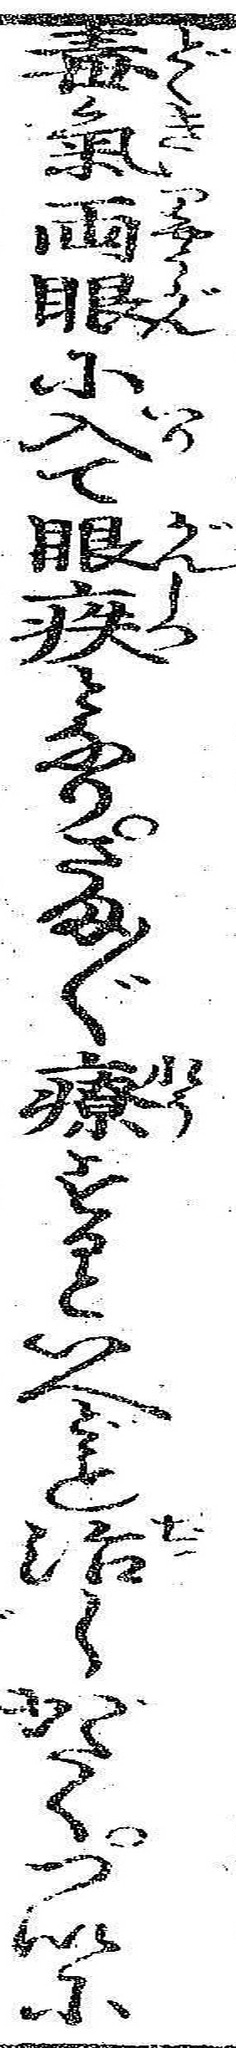毒気両眼に入て眼疾となり。さま〴〵療するといへども治しがたく。ついに
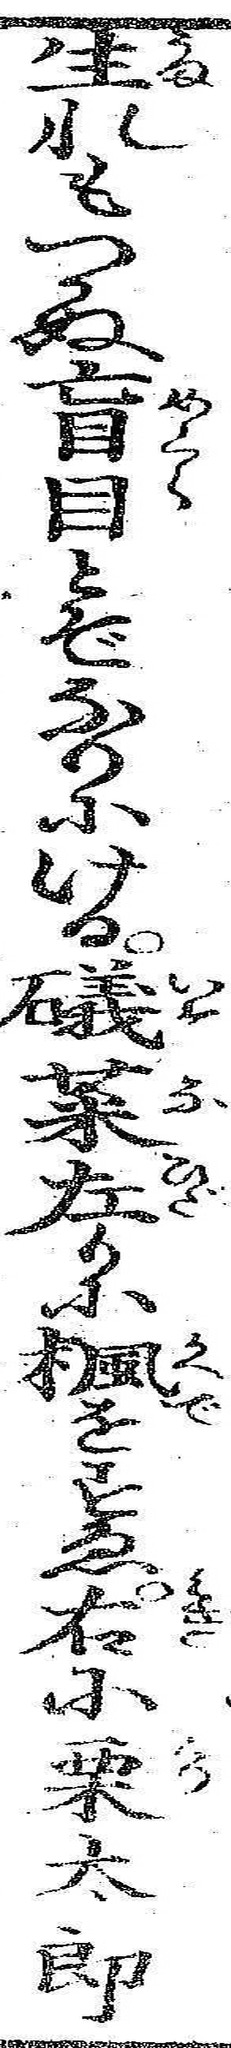生れもつかぬ盲目とぞなりにける。礒菜左りに楓をすゑ。右に栗太郎
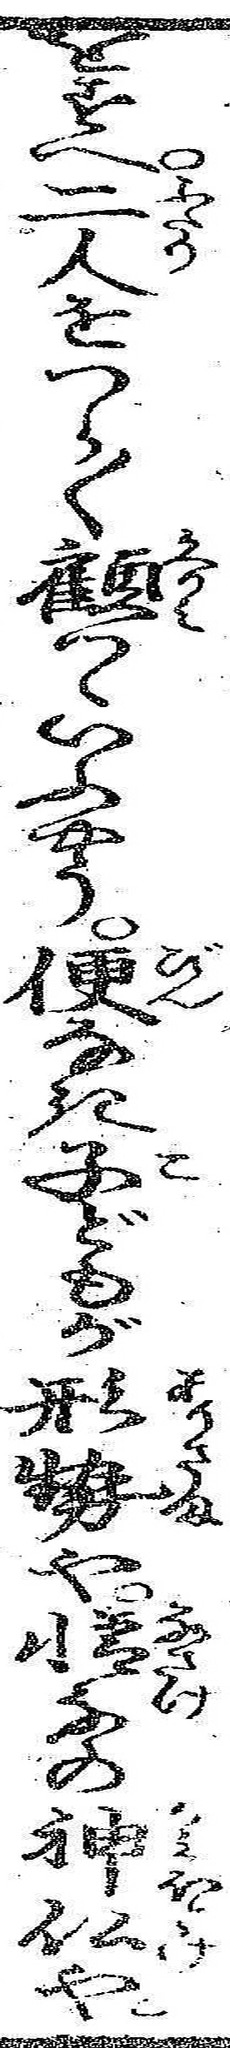をすへ。二人をつら〳〵顧つゝいふやう。便なき子どもが形勢や。情なの神仏や。
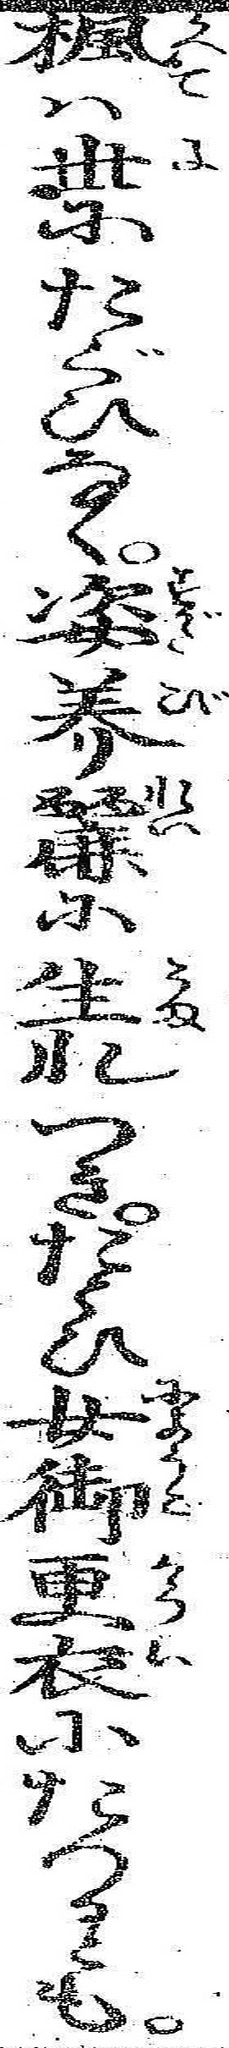楓は世にたぐひなく。姿美麗に生れつき。たとひ女御更衣にたつるとも。
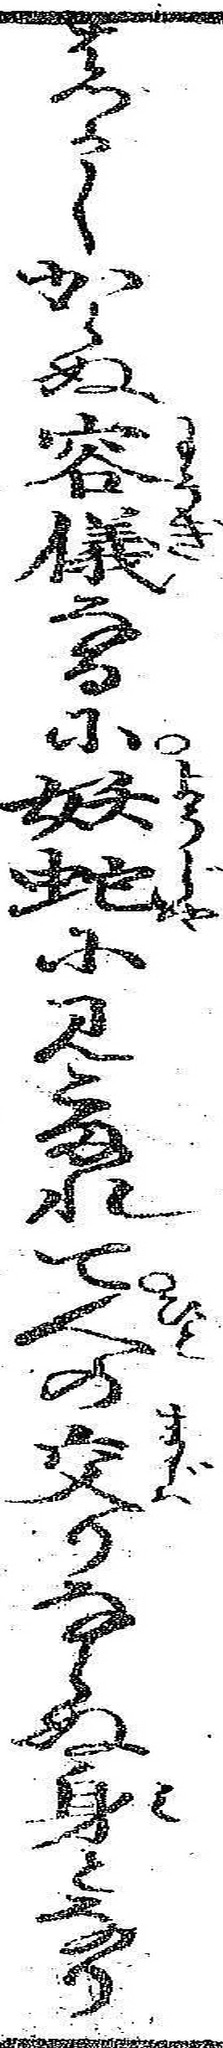はづかしからぬ容儀なるに。妖蛇に見こまれて。人の交りならぬ身となり
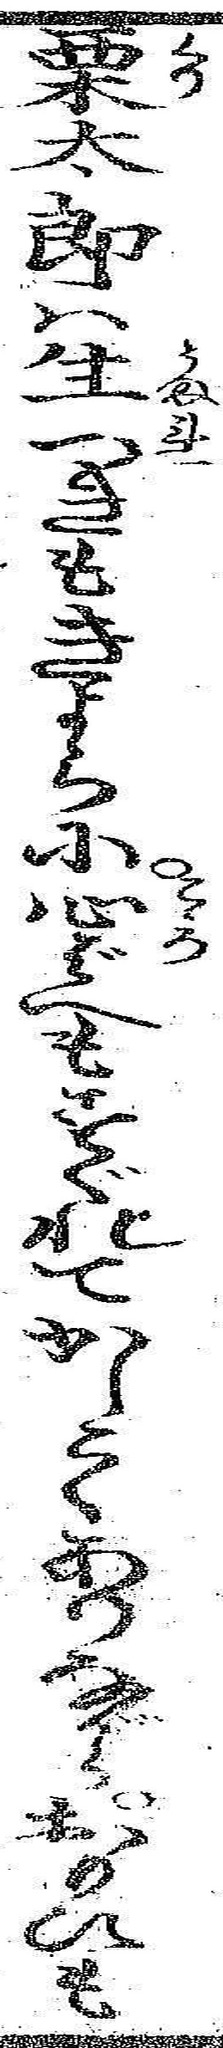栗太郎は生つきもきよらに。心ばへもすぐれてかしこくありながら。おもひも
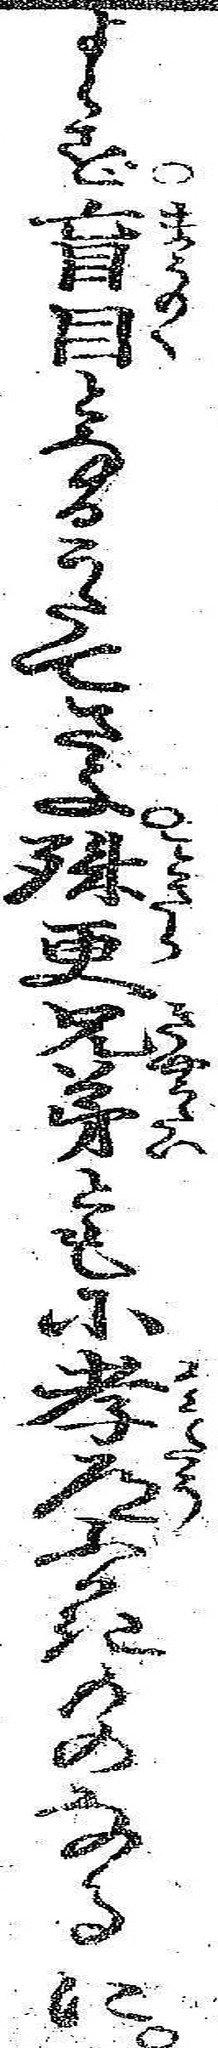よらず。盲目となるうたてさよ。殊更兄第ともに孝道ふかきものなるに。
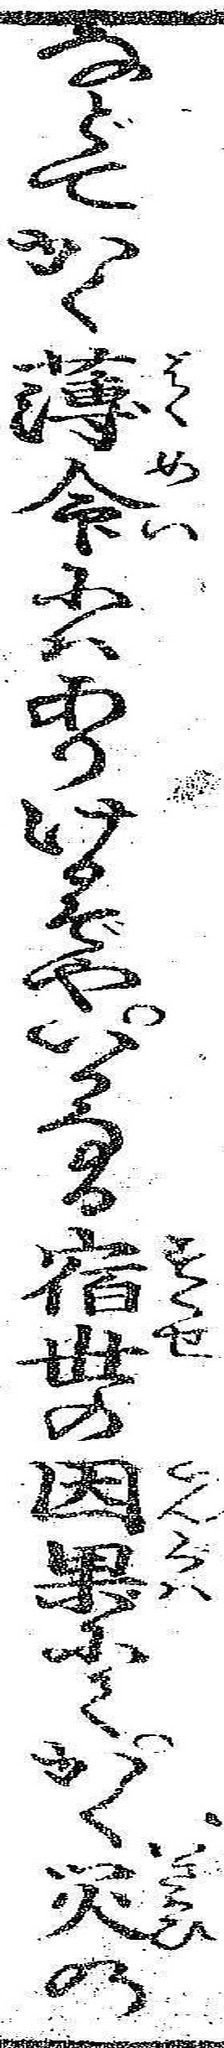などてかく薄命にはありけるぞや。いかなる宿世の因果にて。かく災の
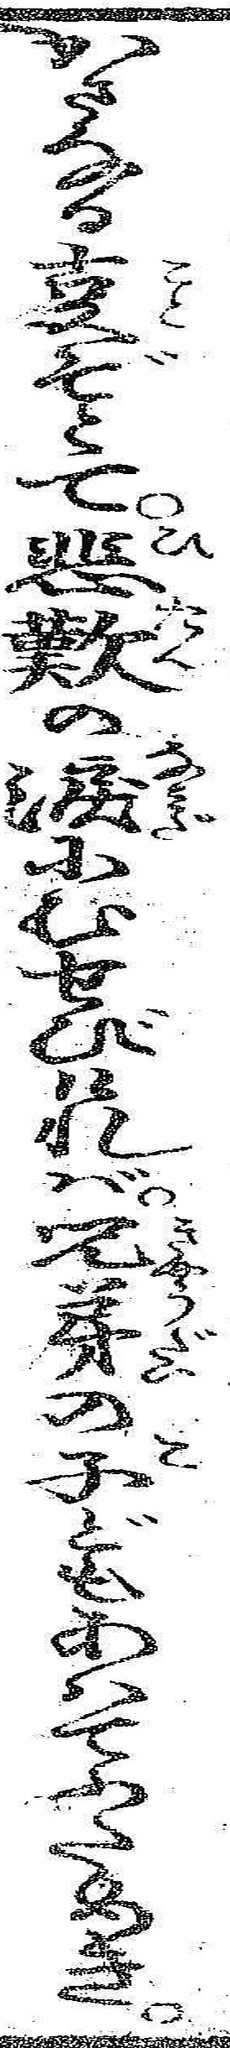かさなる事ぞとて。悲歎の涙にむせびければ。兄弟の子どもあはてふためき。

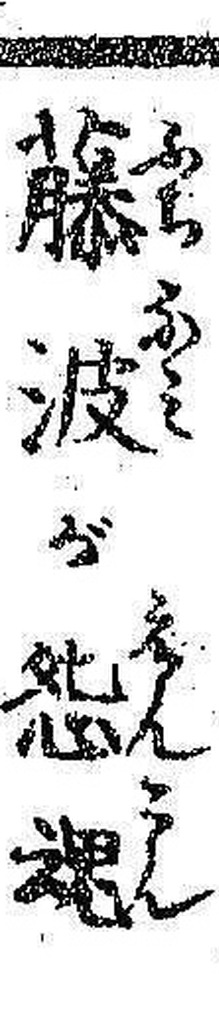藤波が怨魂
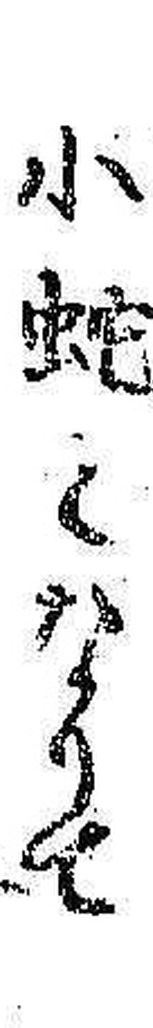小蛇となりて
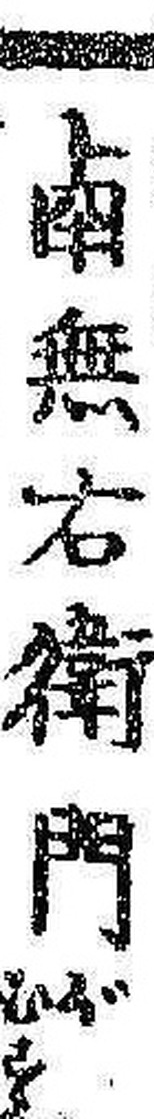南無右衛門が
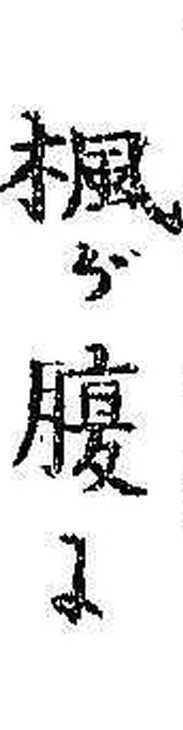楓が腹に
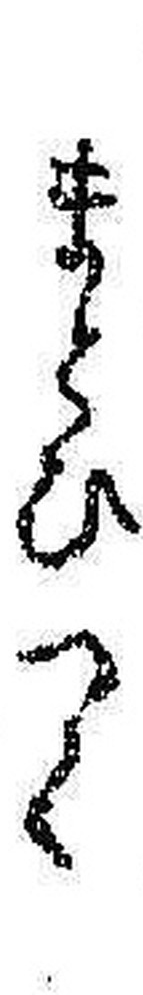まとひつく
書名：昔話稲妻表紙
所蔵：国文学研究資料館
